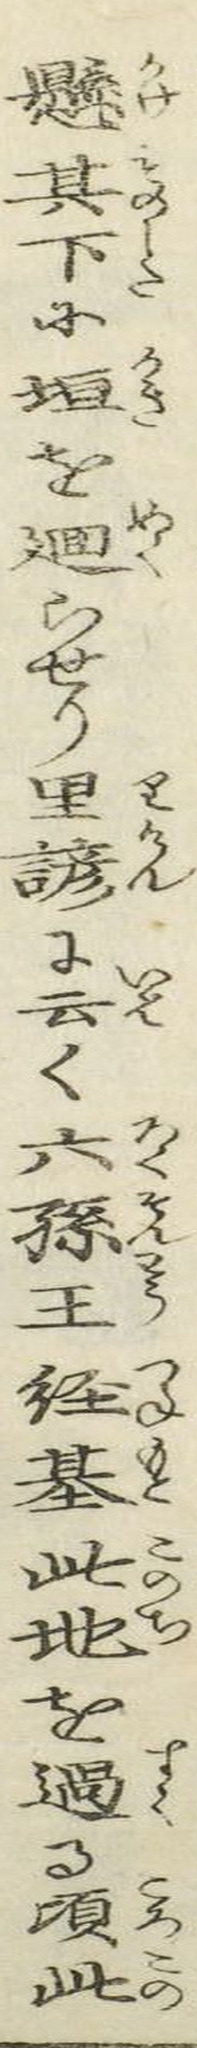懸其下に垣を廻らせり里諺に云く六孫王経基此地を過る頃此
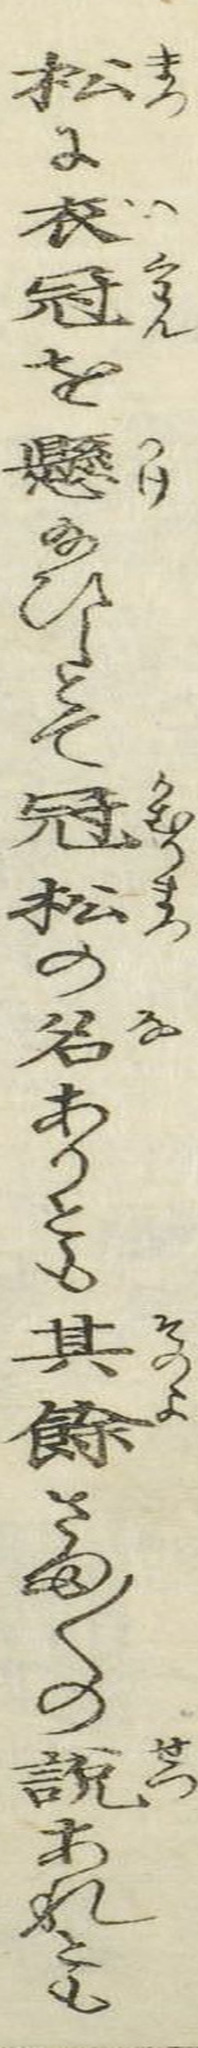松に衣冠を懸給ひしとて冠松の名ありとも其餘さま〳〵の説あれとも
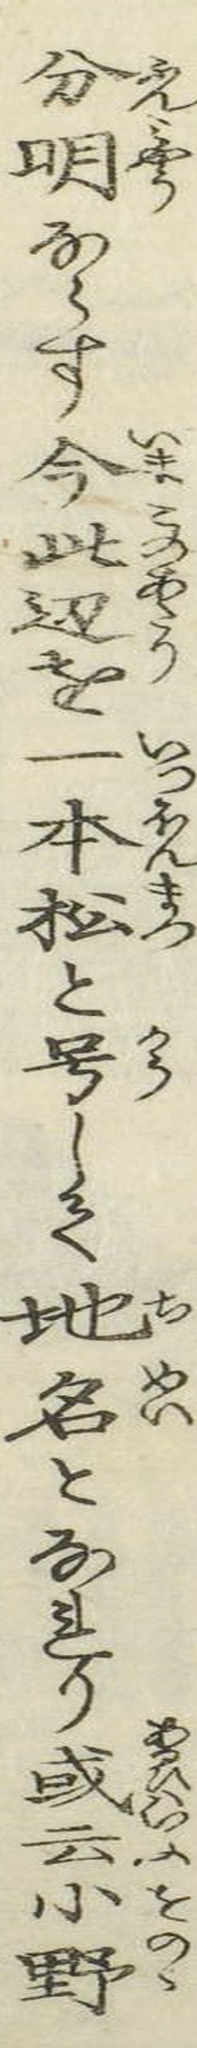分明ならす今此辺を一本松と号して地名となれり或云小野
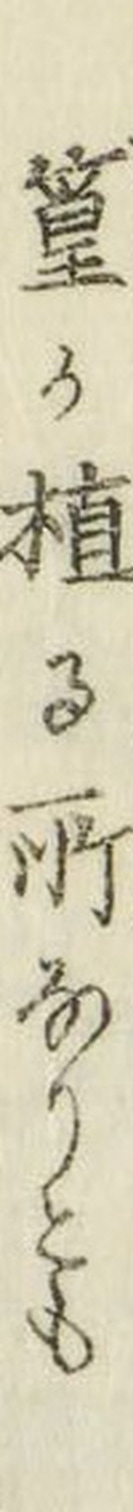篁か植る所なりとも
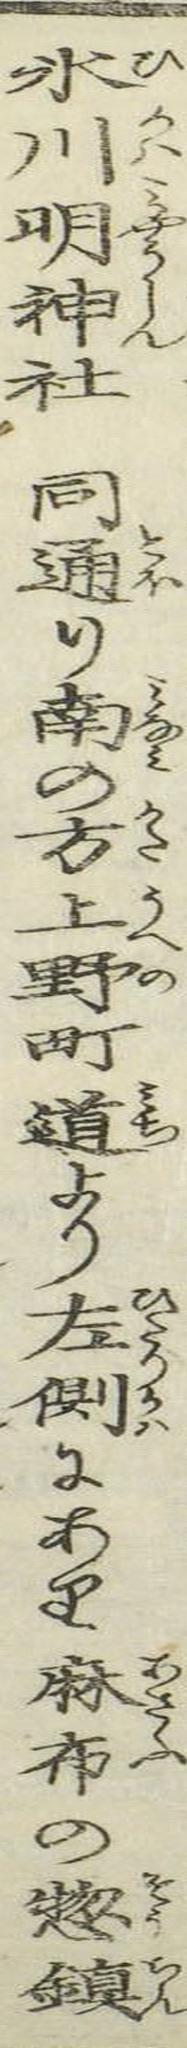氷川明神社同通り南の方上野町道より左側にあり麻布の惣鎮
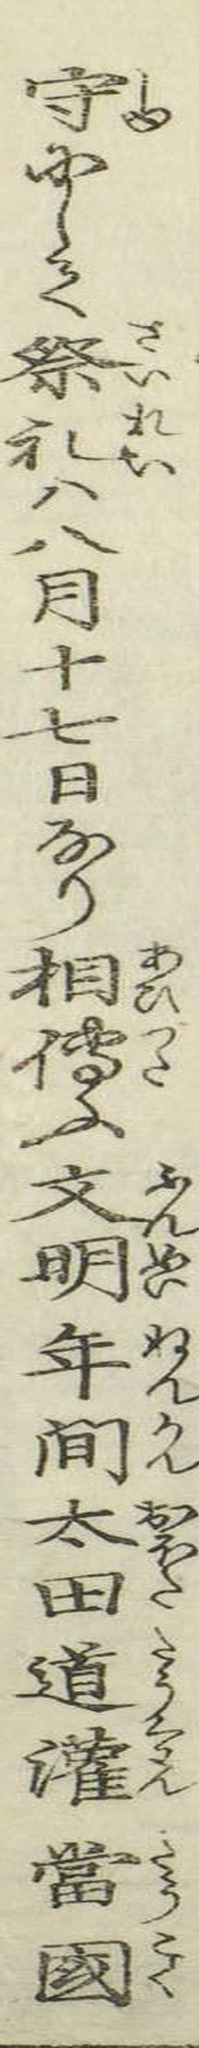守にして祭礼は八月十七日なり相傳ふ文明年間太田道灌當國
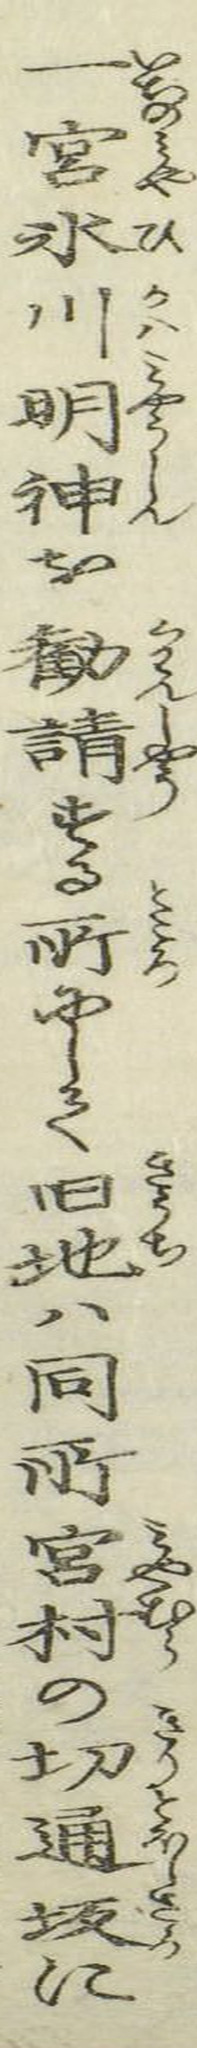一宮氷川明神を勧請する所にして旧地は同所宮村の切通坂に

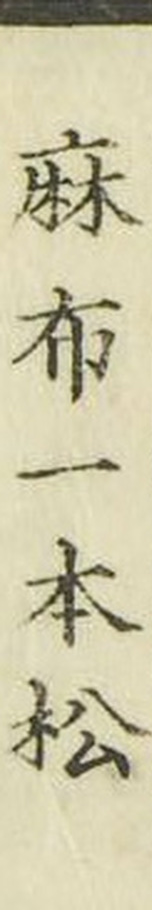麻布一本松
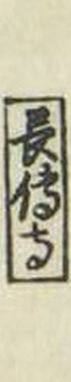長傳寺

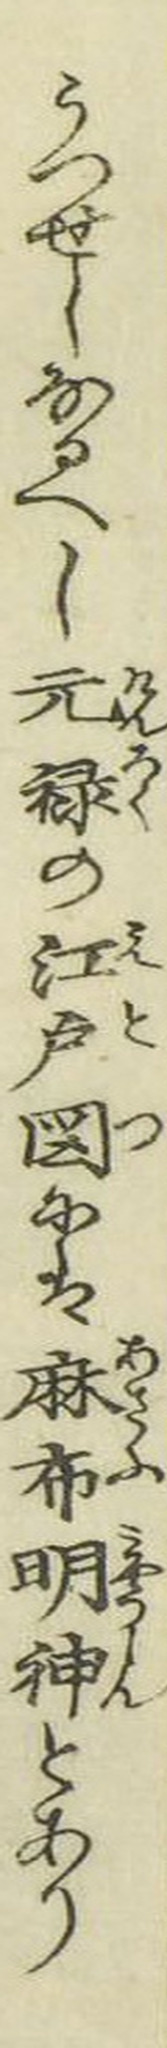うつせしなるへし元禄の江戸図には麻布明神とあり
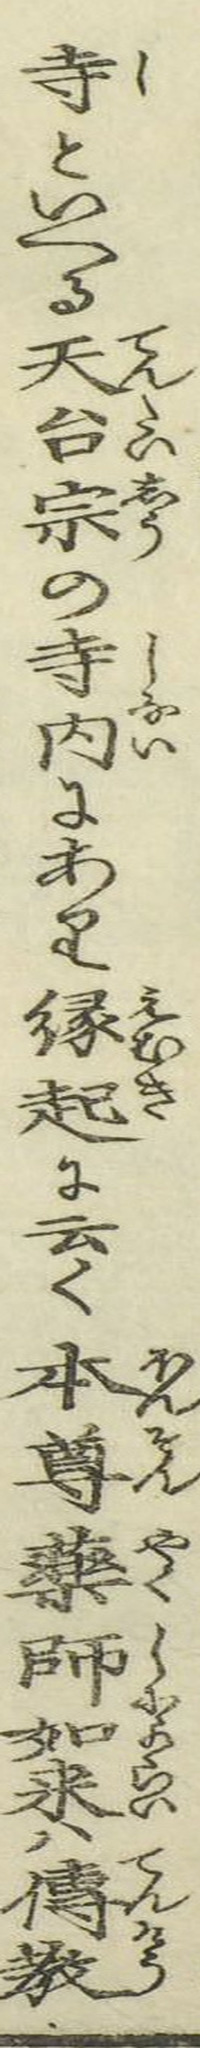寺といへる天台宗の寺内にあり縁起に云く本尊薬師如来は傳教
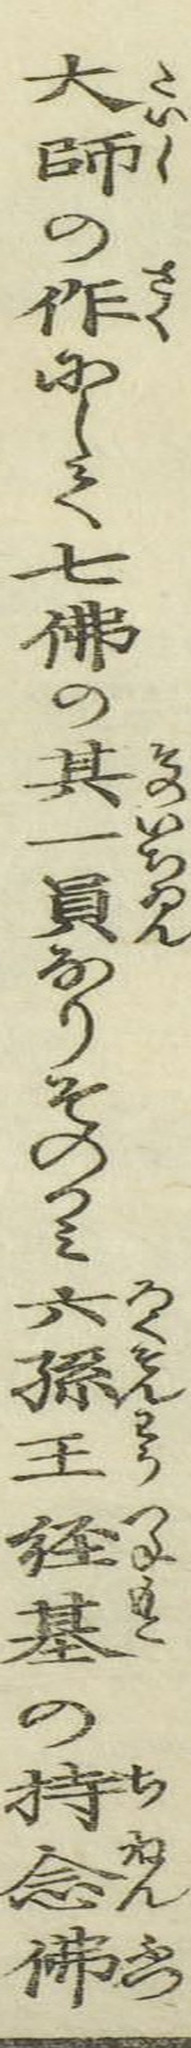大師の作にして七佛の其一員なりそのかみ六孫王経基の持念佛
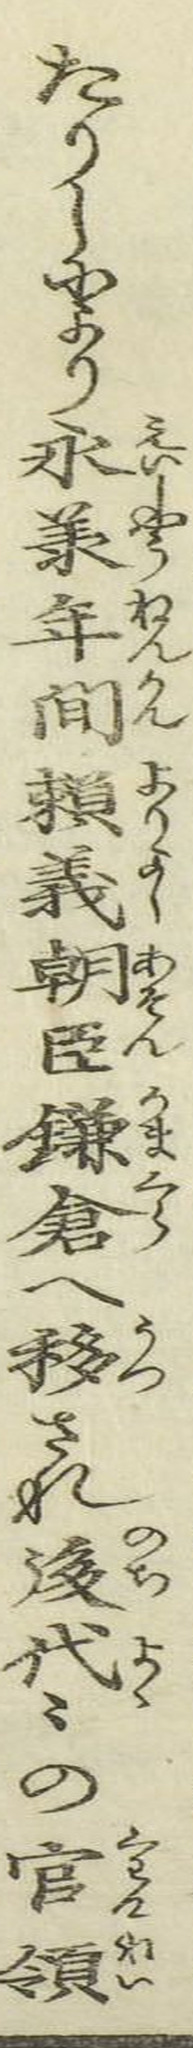たりしにより永承年間頼義朝臣鎌倉へ移され後代々の官領
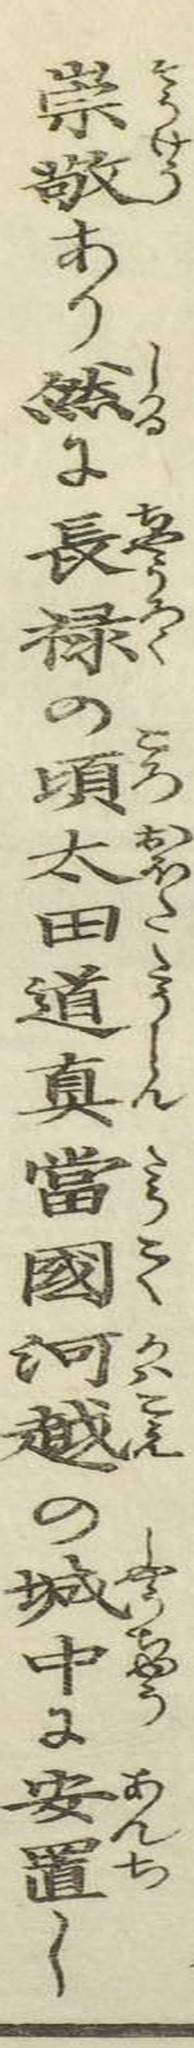崇敬あり然に長禄の頃太田道真當國河越の城中に安置し
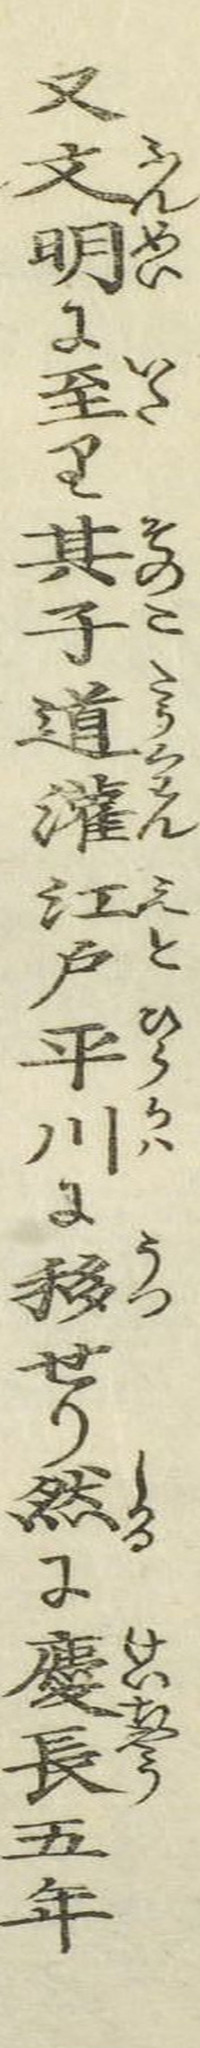又文明に至り其子道灌江戸平川に移せり然に慶長五年
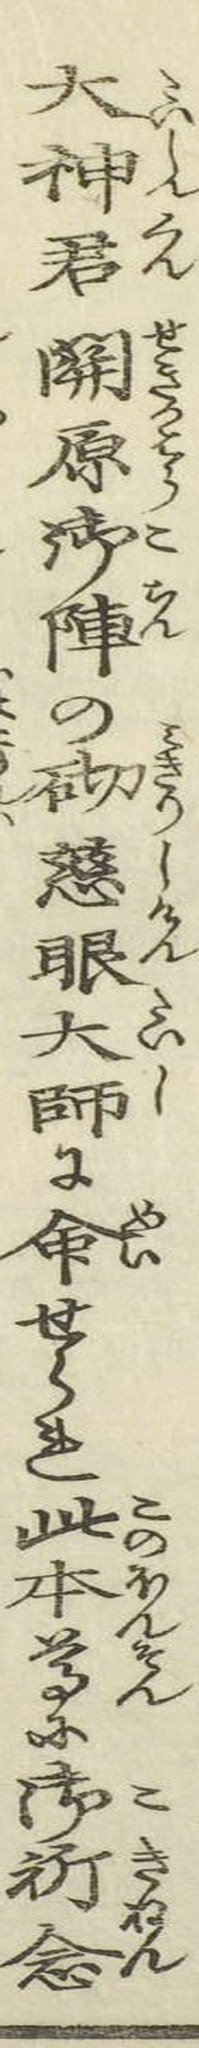大神君關原御陣の砌慈眼大師に命せられ此本尊に御祈念
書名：江戸名所図会 20巻 巻之7
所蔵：東京学芸大学教育コンテンツアーカイブ
